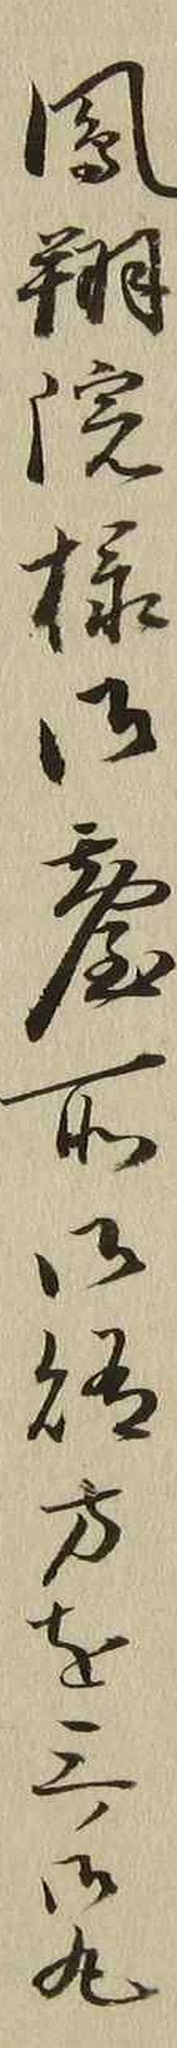鳳翔院様御台所御賄方を三ノ御丸
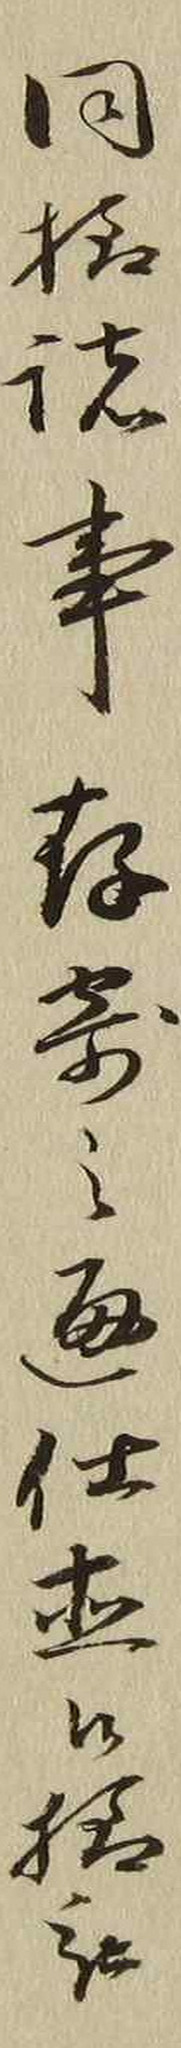同様諸事存寄之通仕直候様被
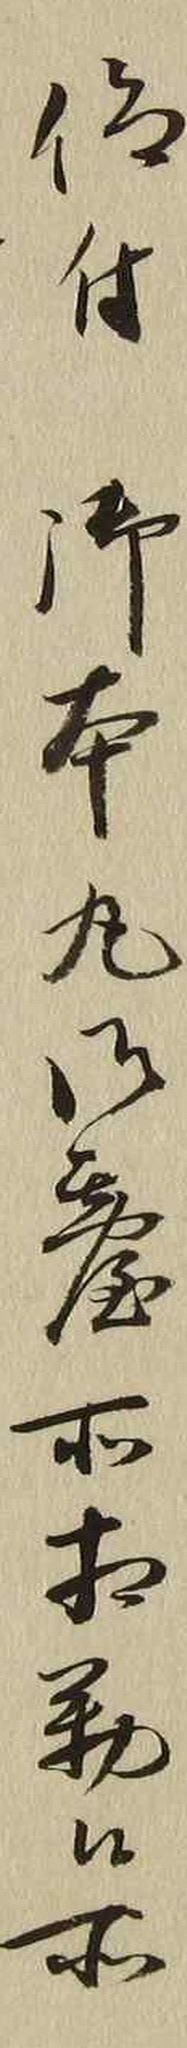仰付御本丸御台所相勤候所
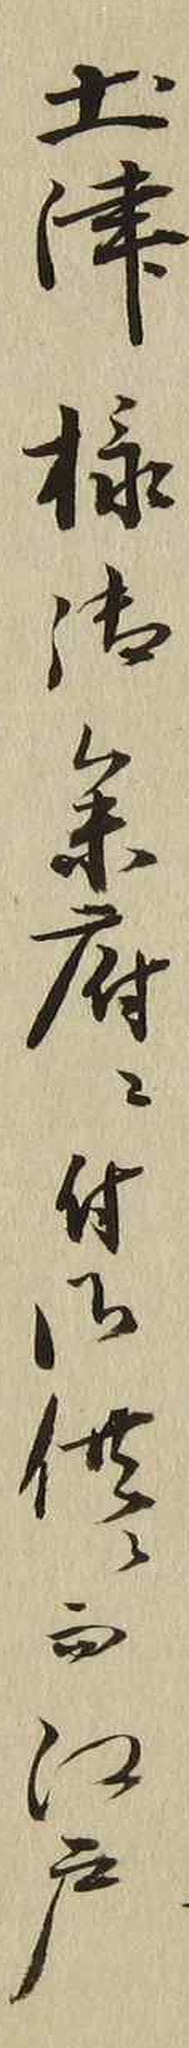土津様御参府ニ付御供ニ而江戸
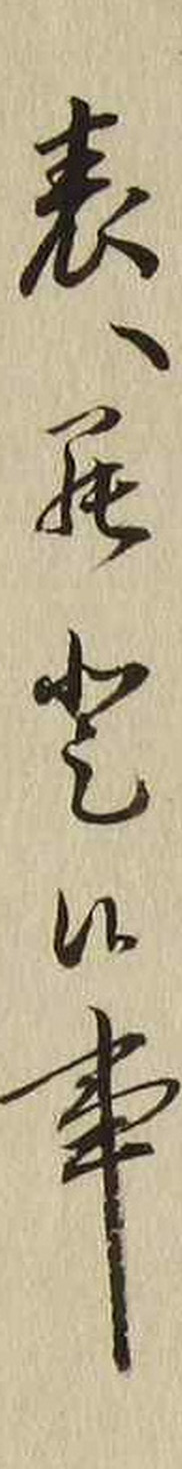表へ罷登候事
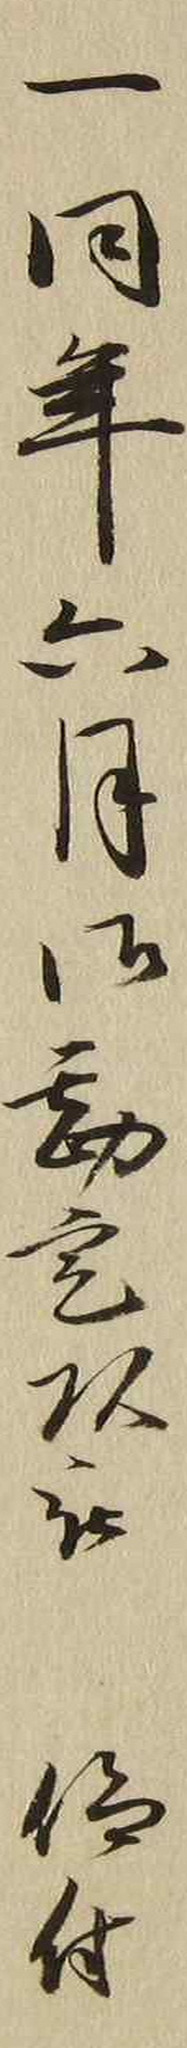一同年六月御勘定頭被仰付
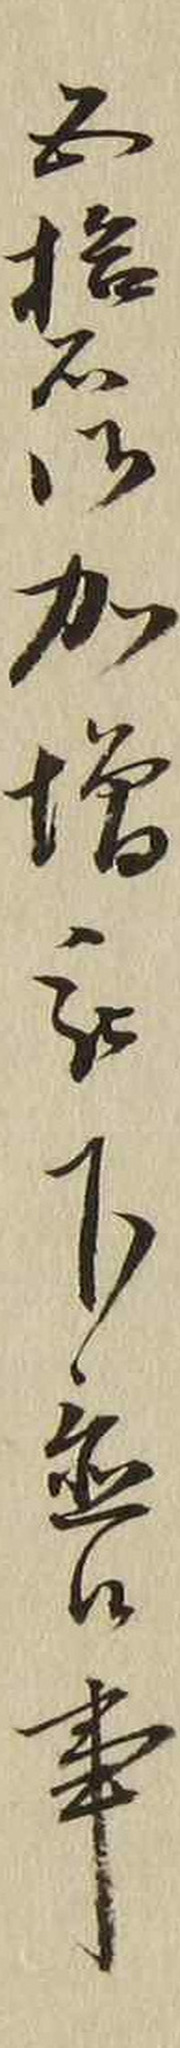五拾石御加増被下置候事
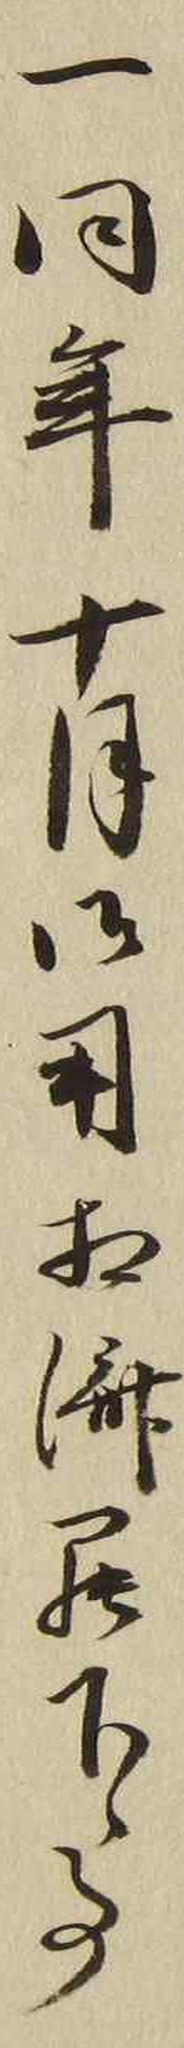一同年十月御用相済罷下候事

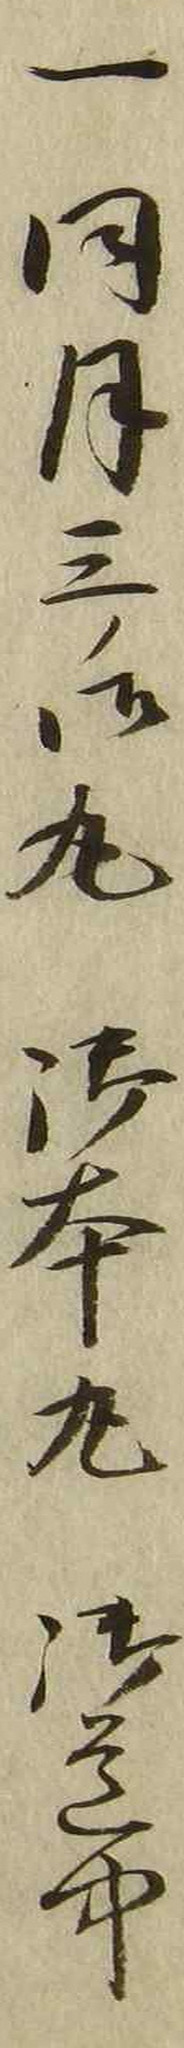一同月三ノ御丸御本丸御道中
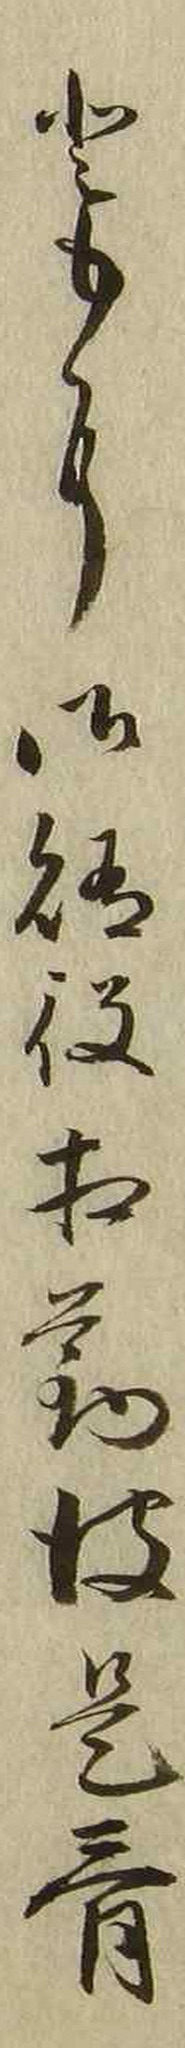ともに御賄役相勤彼是骨
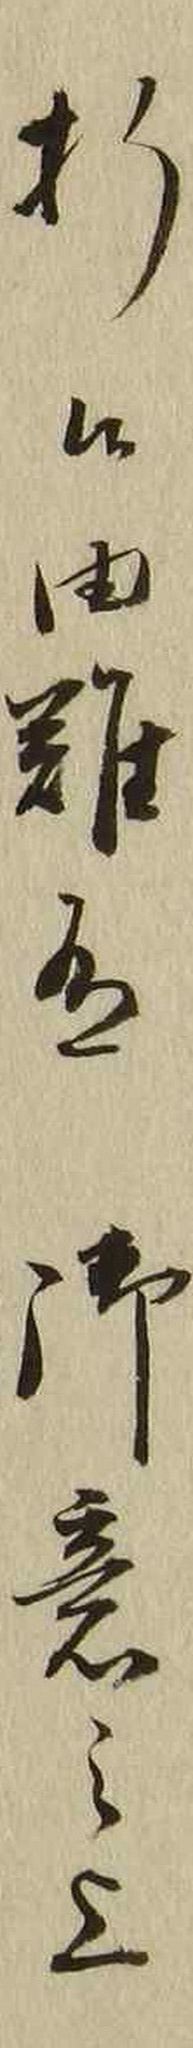折候由難有御意之上
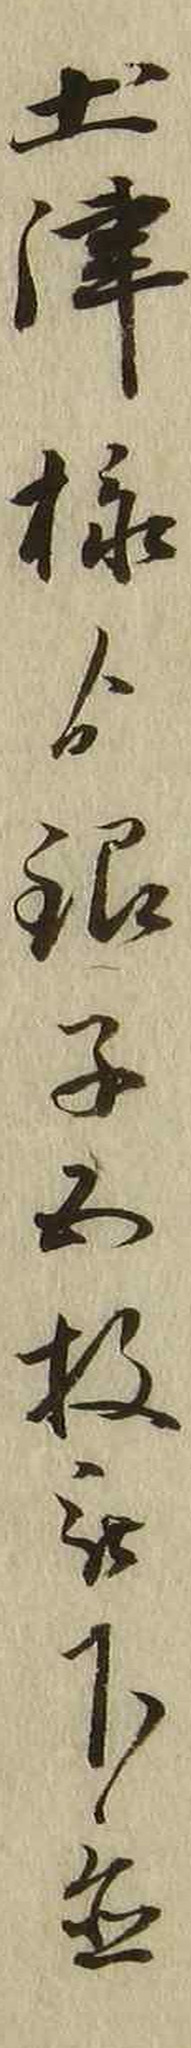土津様ゟ銀子五枚被下置
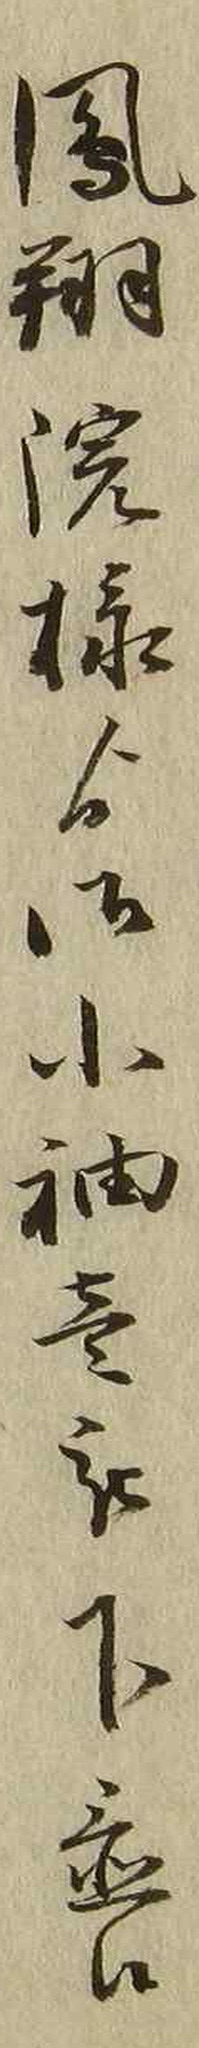鳳翔院様ゟ御小袖壱被下置候
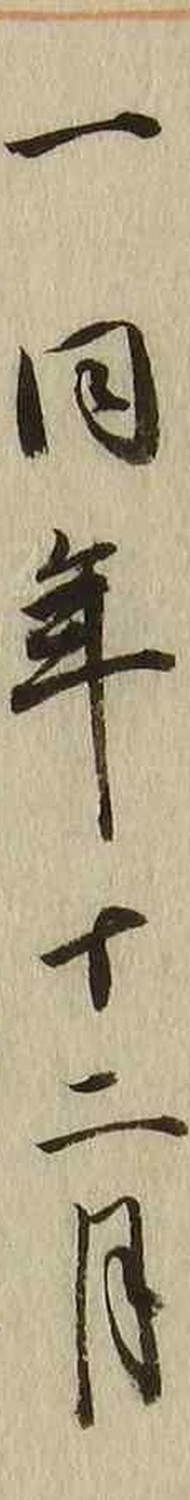一同年十二月
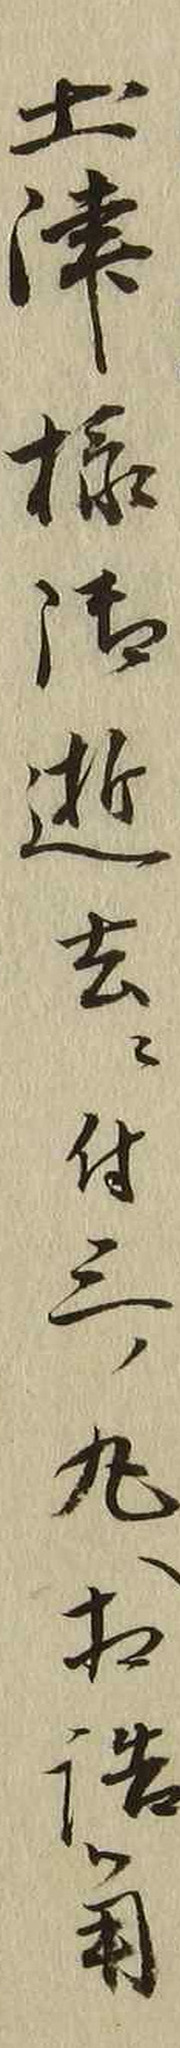土津様御逝去ニ付三ノ丸へ御詰御用
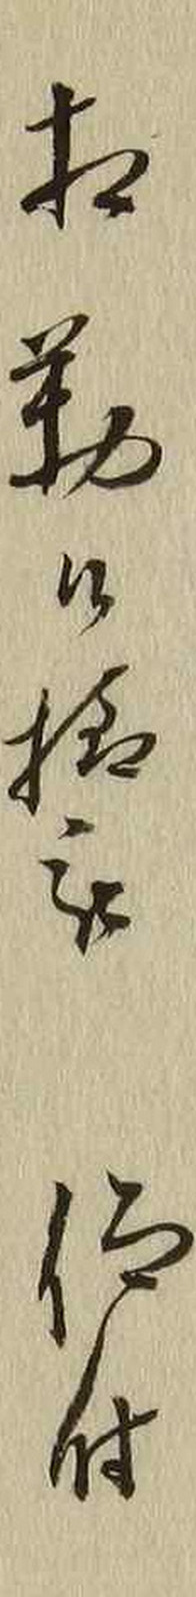相勤候様被仰付
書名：諸士系譜　巻之61　と之部4
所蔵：会津若松市立会津図書館
